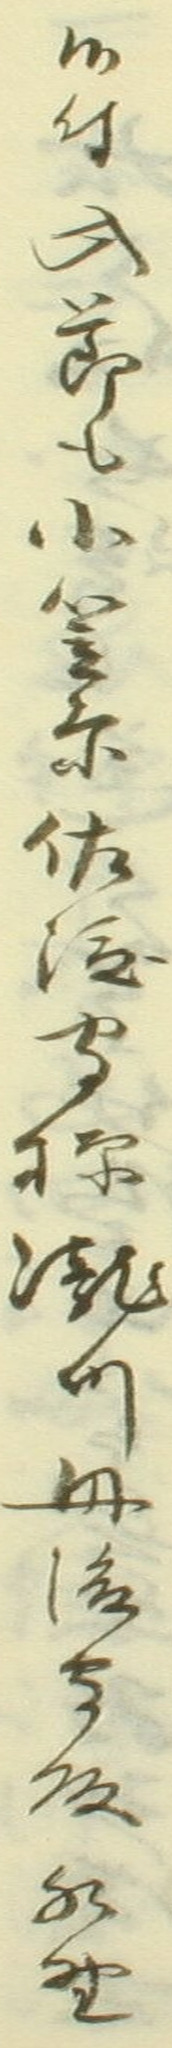候付此節も小笠原佐渡守様瀧川丹後守殿水野
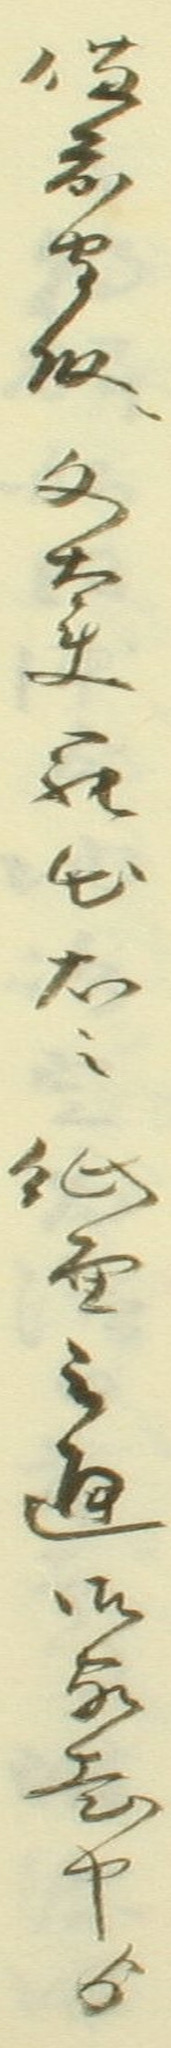備前守殿へ文太夫罷出右之紙面之通御家老中より
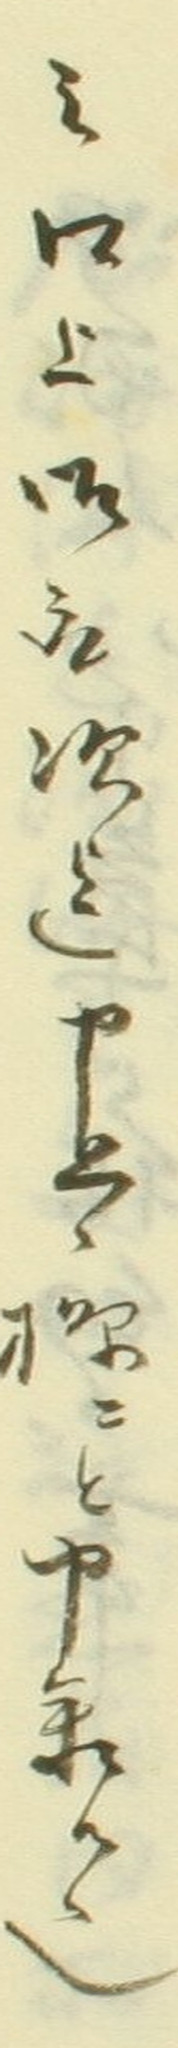之口上御取次迄申上候様にと申参候也
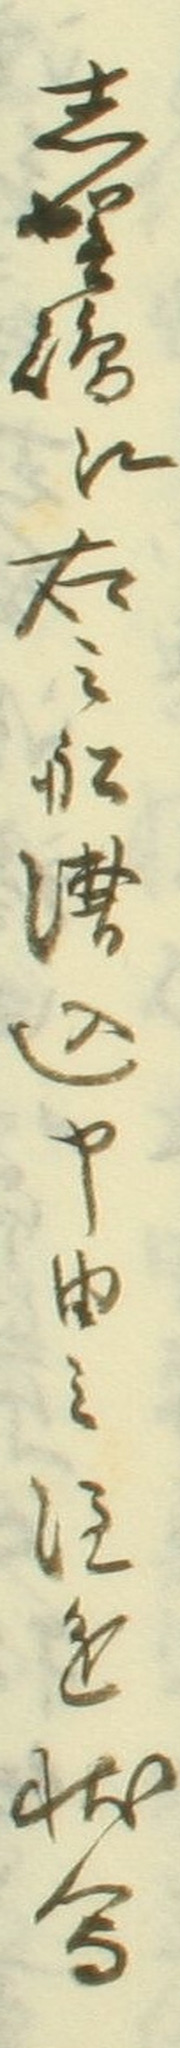志賀島え右之船漕込申由之注進状写
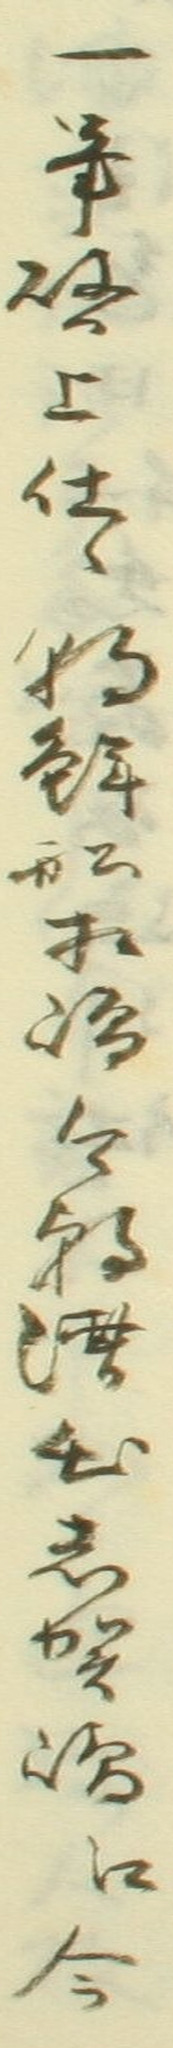一筆啓上候仕候朝鮮船相島今朝漕出志賀島え今
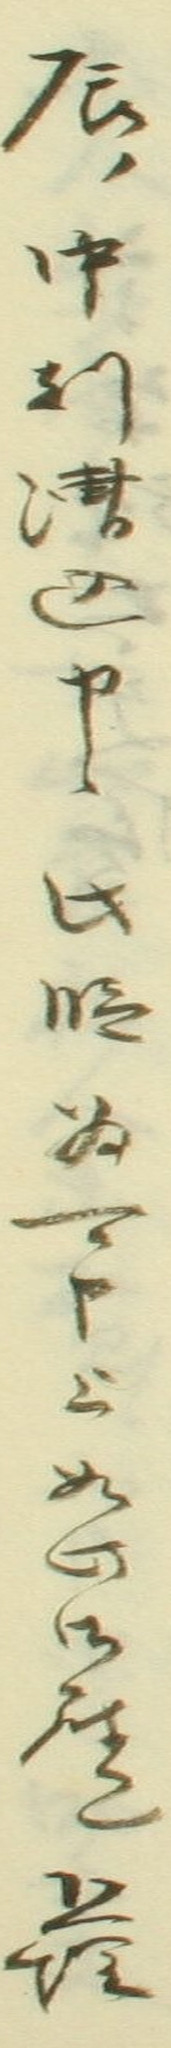辰の中刻漕込申候此段為可申上如此御座候恐惶

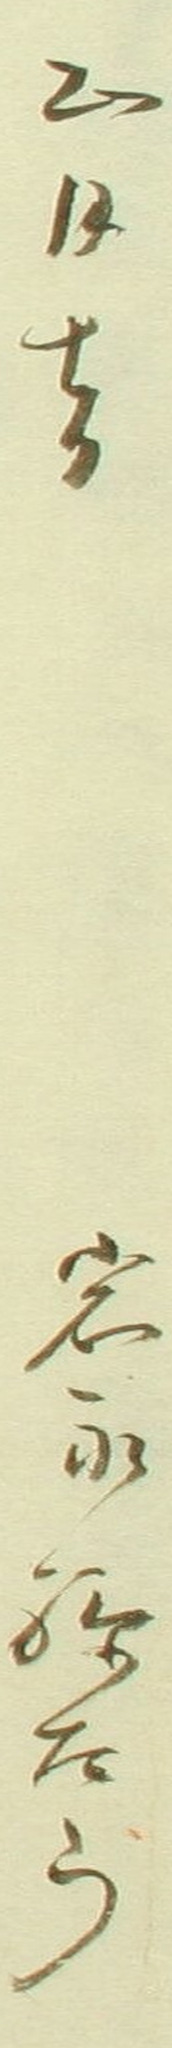正月七日岩永弥左衛門
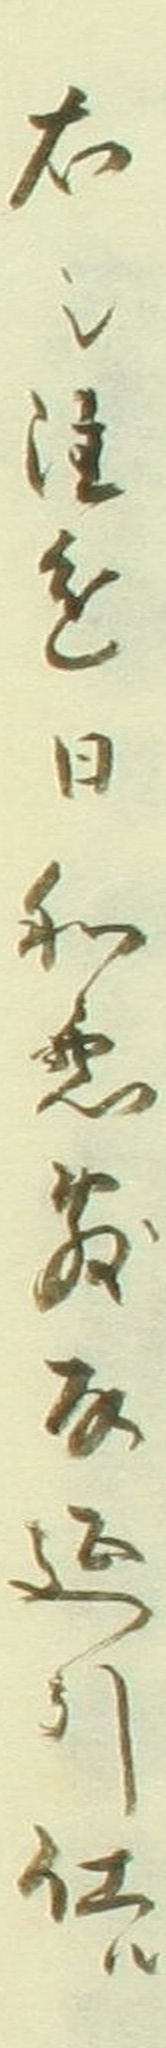右之注進日和悪敷故延引仕候
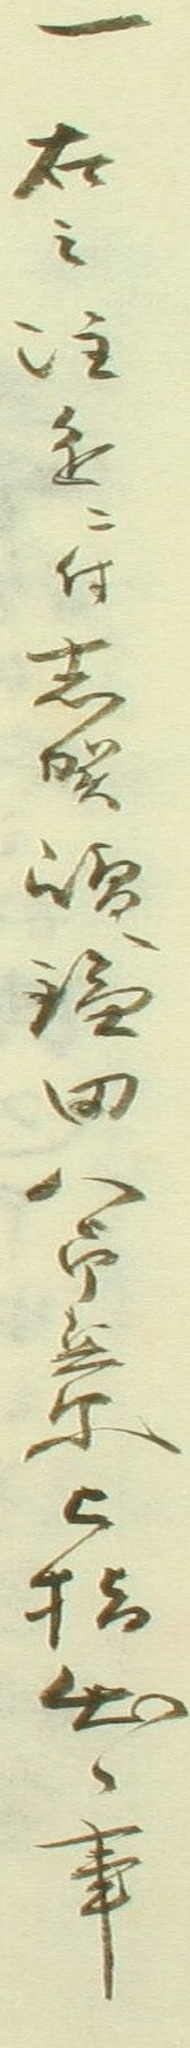一右之注進に付志賀島鎌田八郎兵衛被指出候事
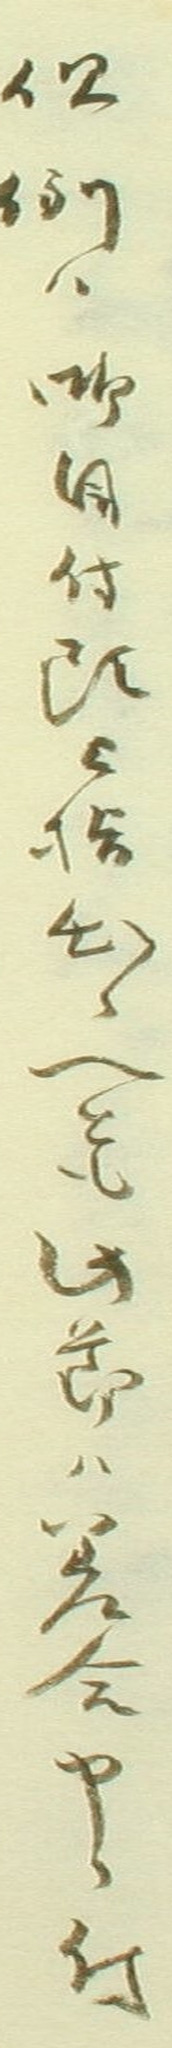但例は御目付頭被指出候へとも此節は差合申候付
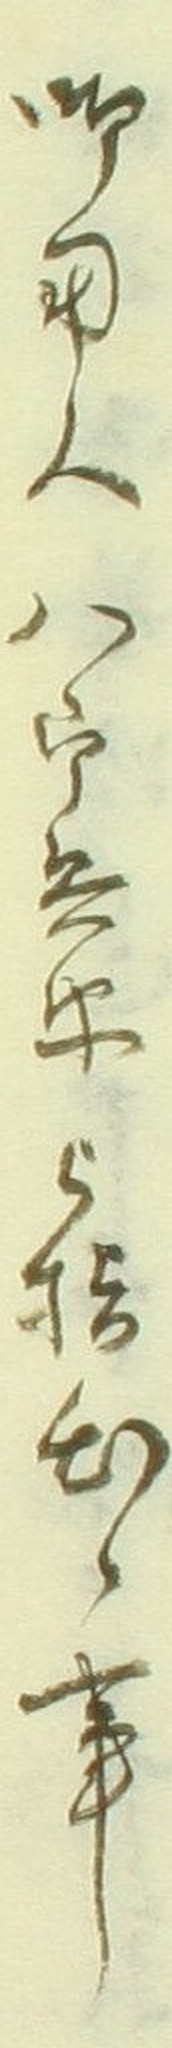御用人八郎兵衛被指出候事
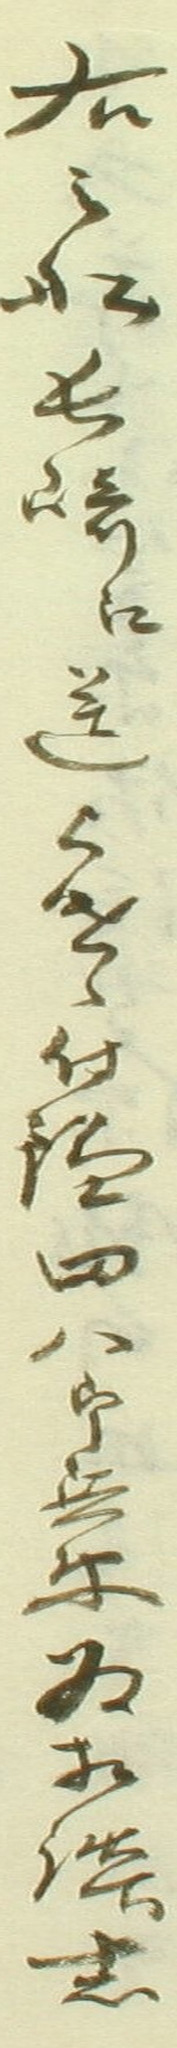右之船長崎え送被遣候付鎌田八郎兵衛為相談志
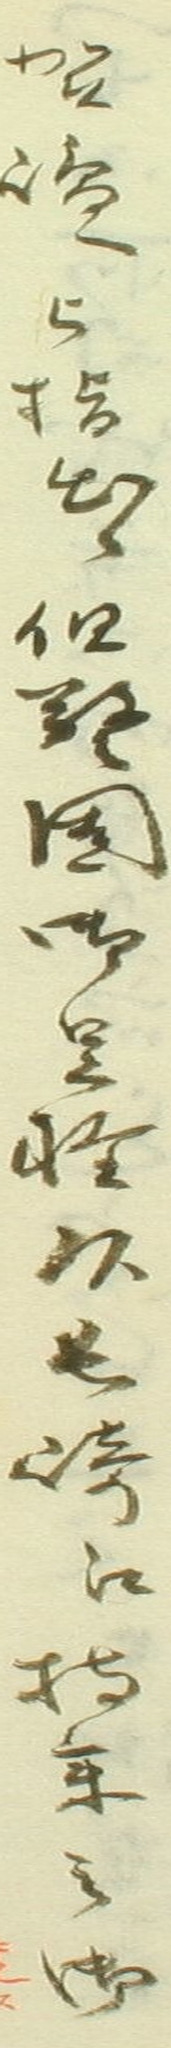賀島へ被指出候但警固御足軽頭長崎え持参之御
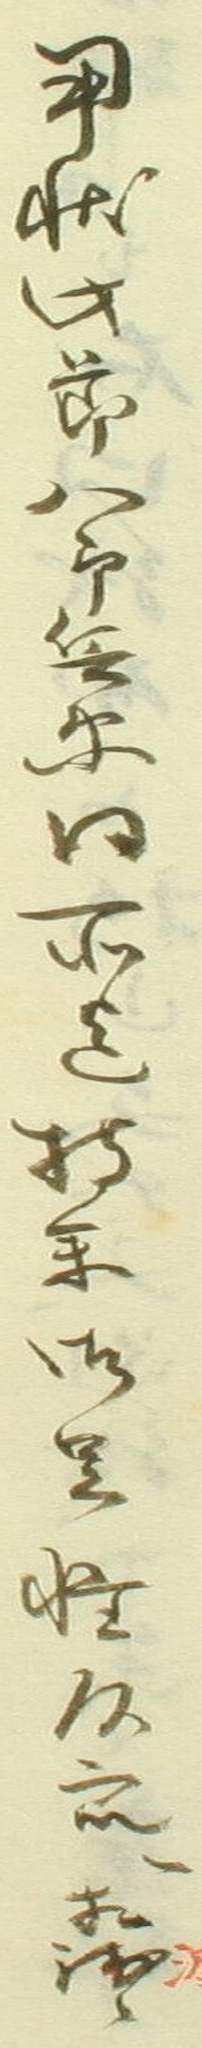用状此節八郎兵衛同所迄持参御足軽頭衆へ相渡す
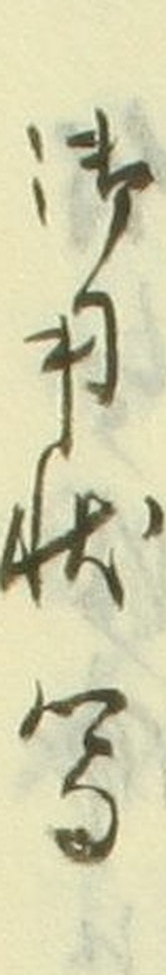御用状写
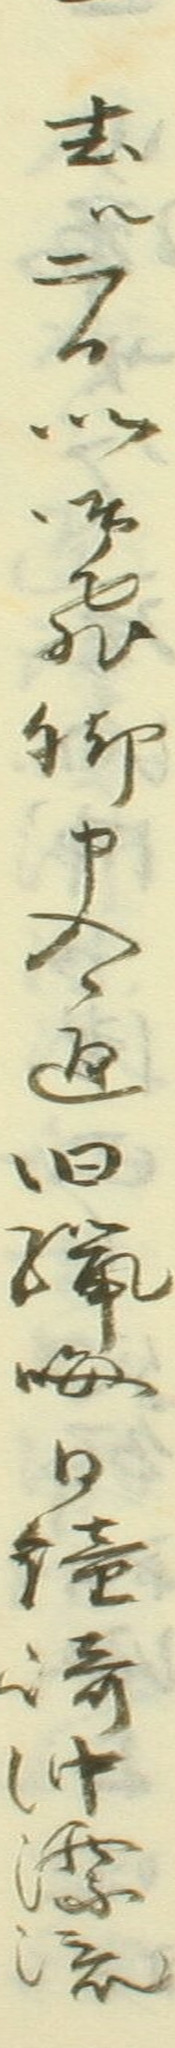一去る二日以御飛脚申入候通旧臘晦日鐘崎沖漂流
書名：朝鮮船御領内漂流記 坤
